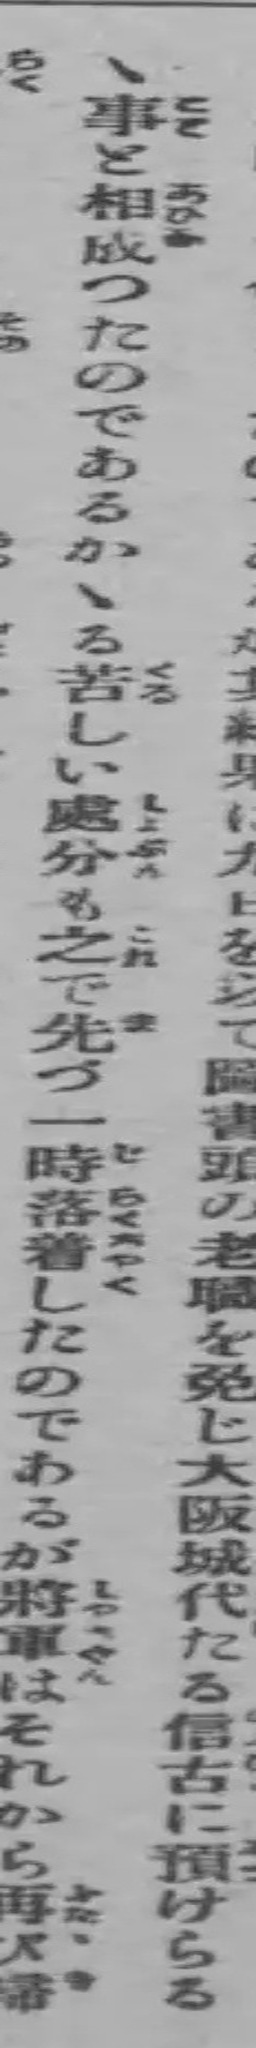ゝ事と相成つたのであるかゝる苦しい処分も之で先づ一時落着したのであるが将軍はそれから再び帰
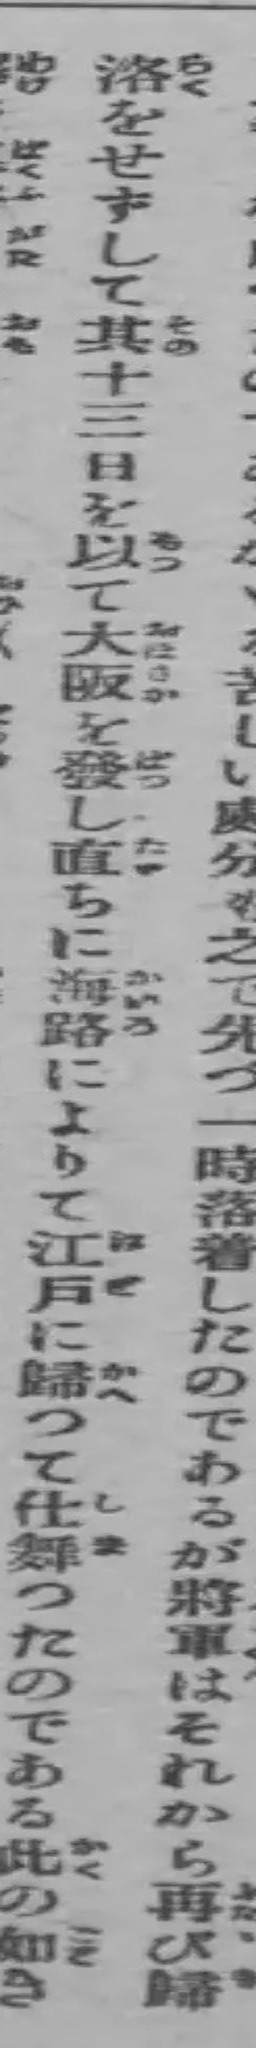将軍の東帰洛をせずして其十三日を以て大阪を発し直ちに海路によりて江戸に帰つて仕舞つたのである此の如き
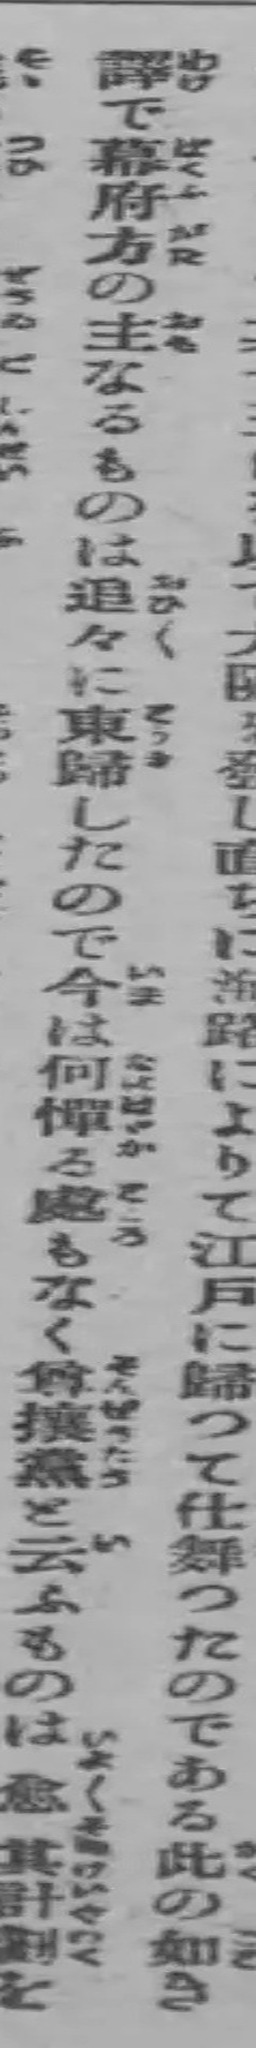訳で幕府方の主なるものは追々に東帰したので今は何憚る処もなく尊攘党と云ふものは愈其計画を
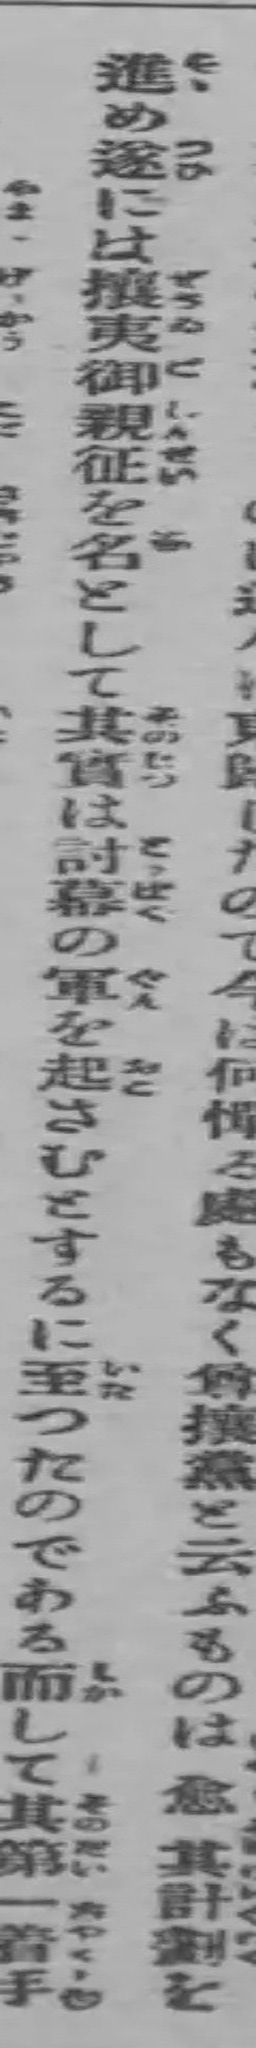進め遂には攘夷御親征を名として其実は倒幕の軍を起さむとするに至つたのである而して其第一着手
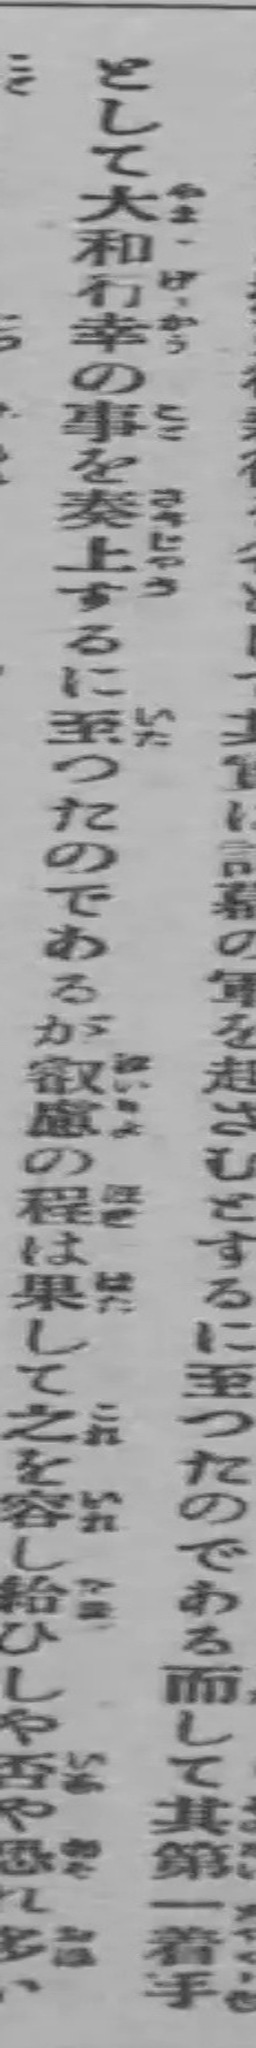として大和行幸の事を奏上するに至つたのであるが叡慮の程は果して之を容し給ひしや否や恐れ多い
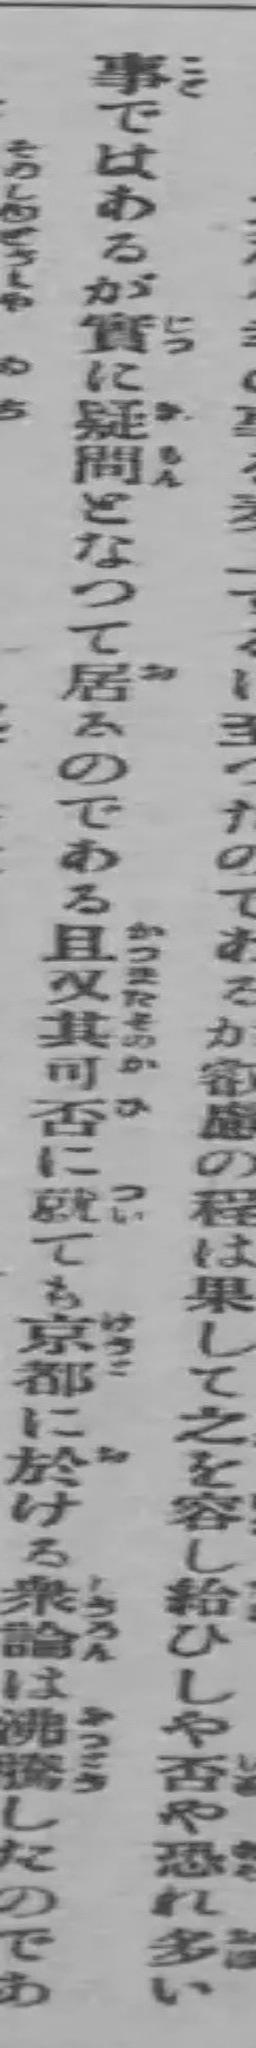事ではあるが実に疑問となつて居るのである且又其可否に就ても京都に於ける衆論は沸騰したのであ
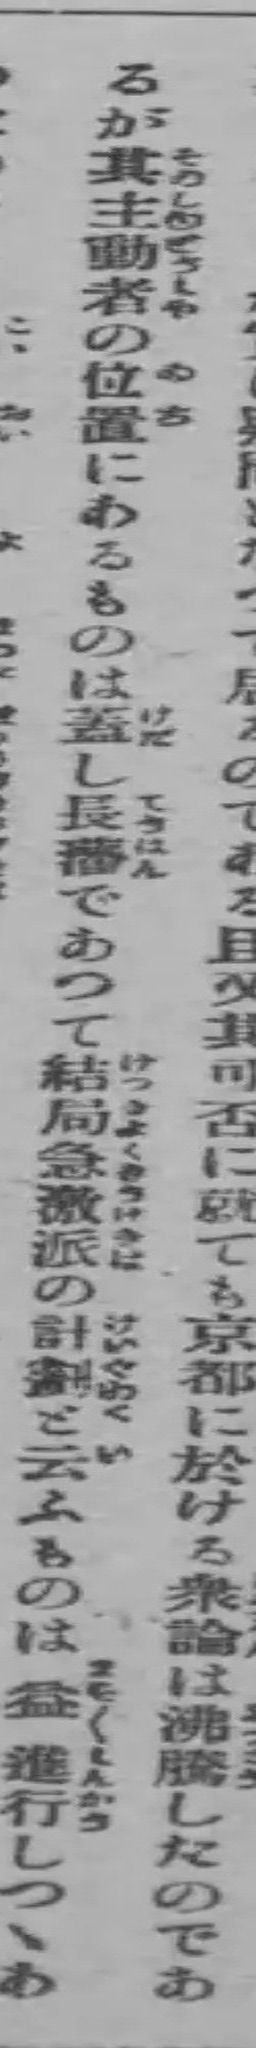るが其主動者の位置にあるものは蓋し長藩であつて結局急激派の計画と云ふものは益進行しつゝあ
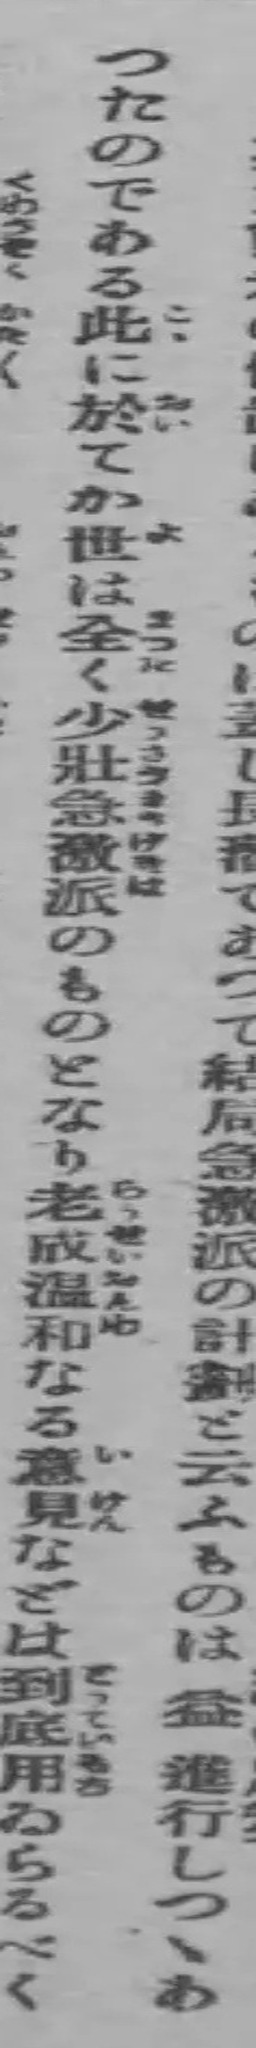つたのである此に於てか世は全く少壮急激派のものとなり老成温和なる意見などは到底用ゐらるべく
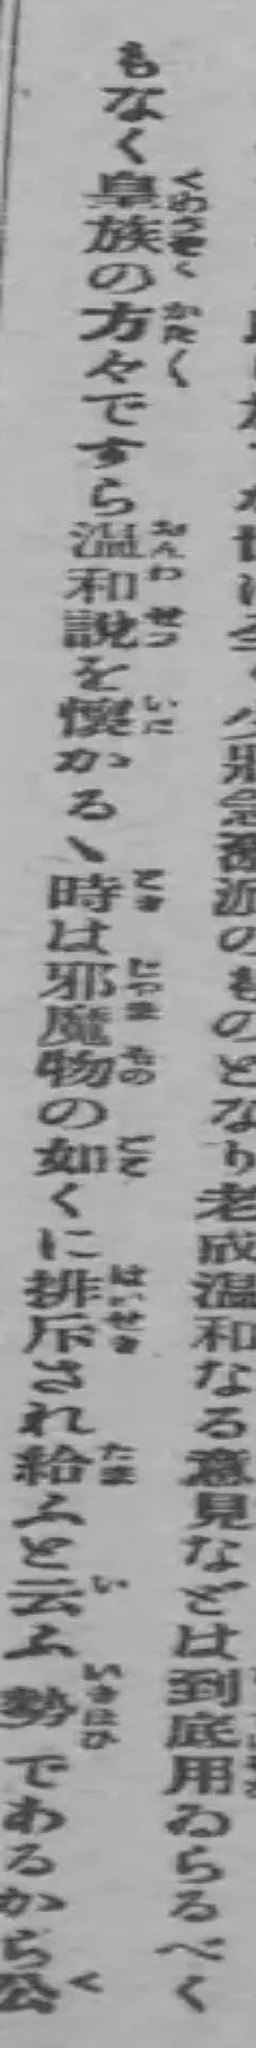もなく皇族の方々ですら温和説を懐かるゝ時は邪魔物の如くに排斥され給ふと云ふ勢であるから公
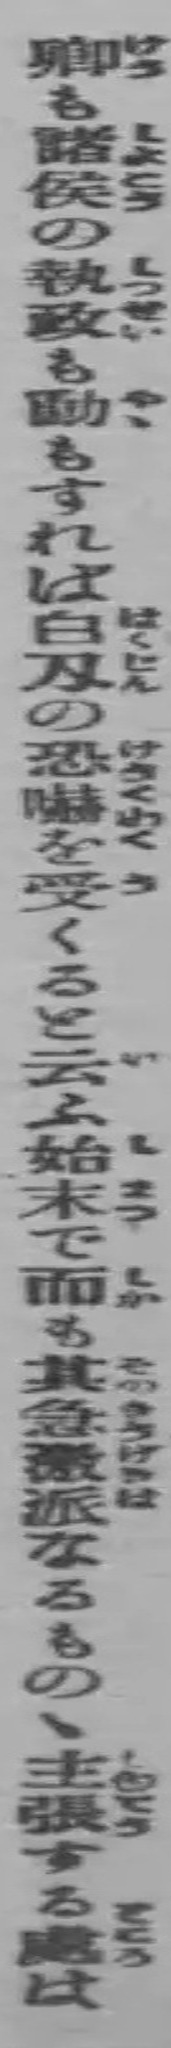卿も諸侯の執政も動もすれば白刃の恐嚇を受くると云ふ始末で而も其急激派なるものゝ主張する処は
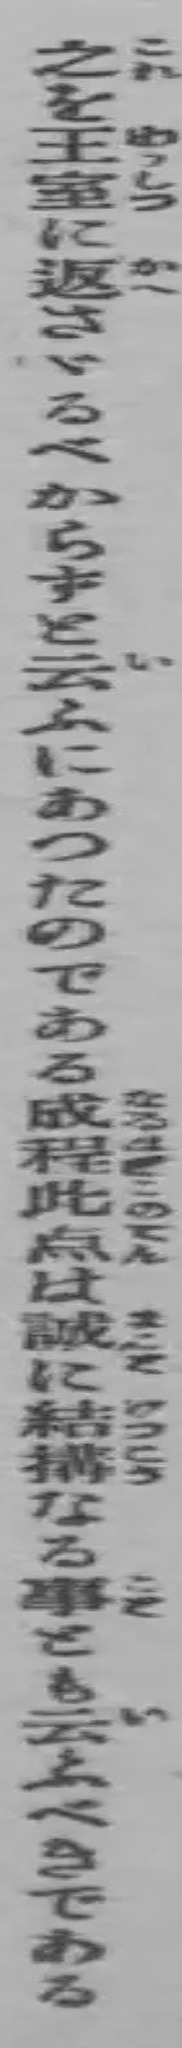之を王室に返さゞるべからずと云ふにあつたのである成程此点は誠に結構なる事とも云ふべきである
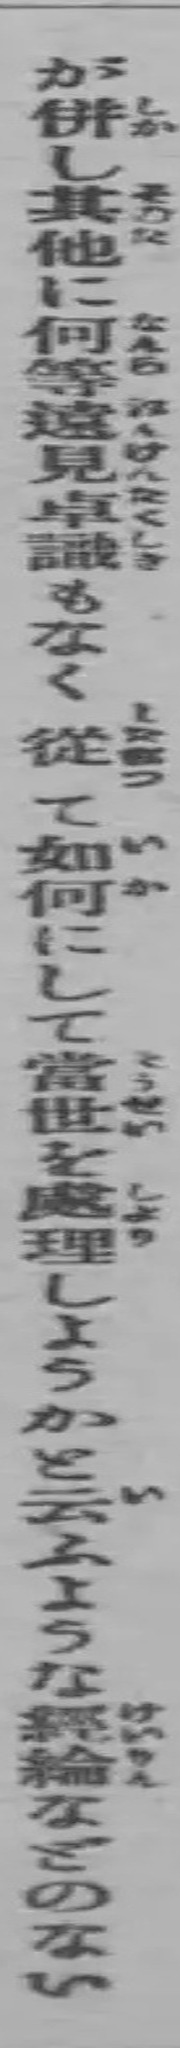が併し其他に何等遠見卓識もなく従て如何にして当世を処理しようかと云ふような経綸などのない
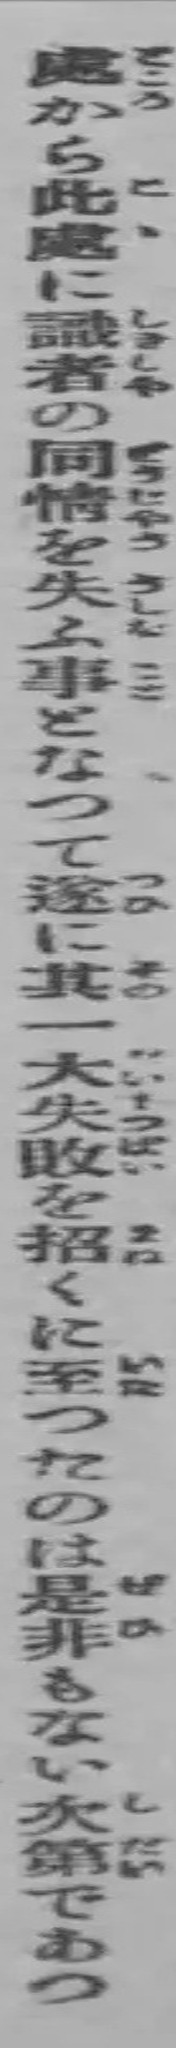処から此処に識者の同情を失ふ事となつて遂に其一大失敗を招くに至つたのは是非もない次第であつ
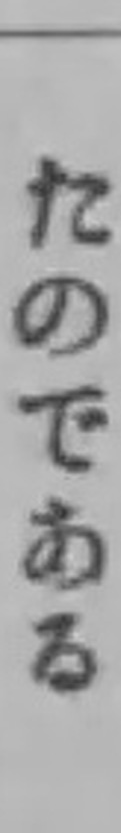たのである
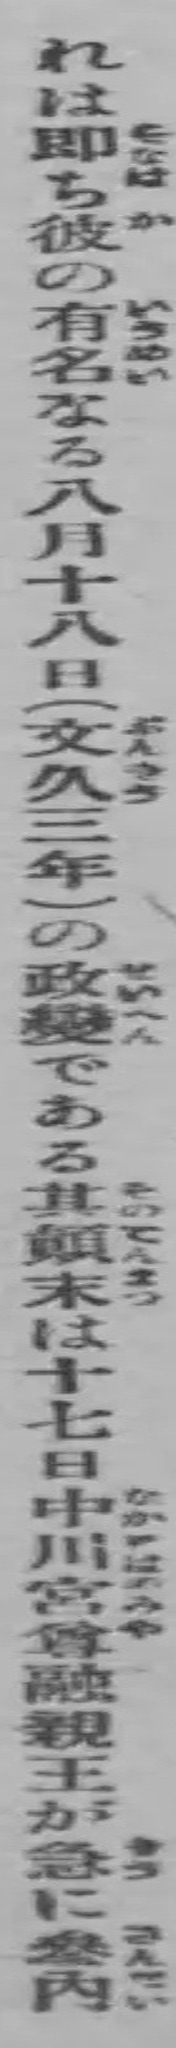れは即ち彼の有名なる八月十八日(文久三年)の政変である其顛末は十七日中川宮尊融親王が急に参内
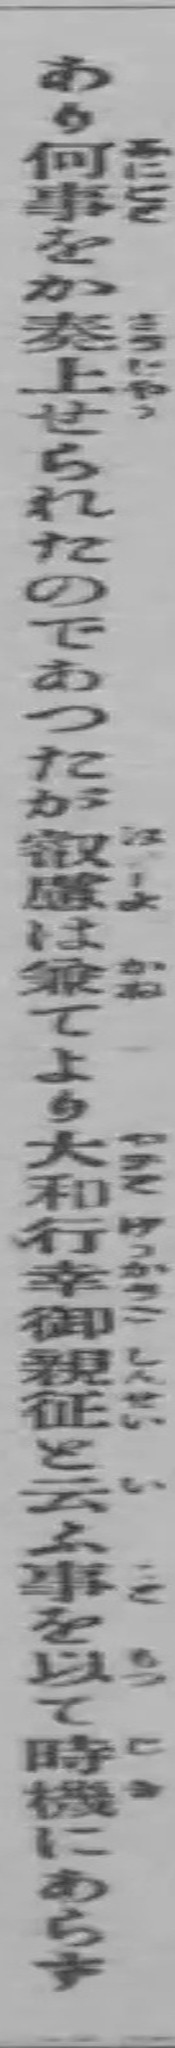あり何事をか奏上せられたのであつたが叡慮は兼てより大和行幸御親征と云ふ事を以て時機にあらず
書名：豊橋市史談
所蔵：国立国会図書館 National Diet Library, JAPAN
